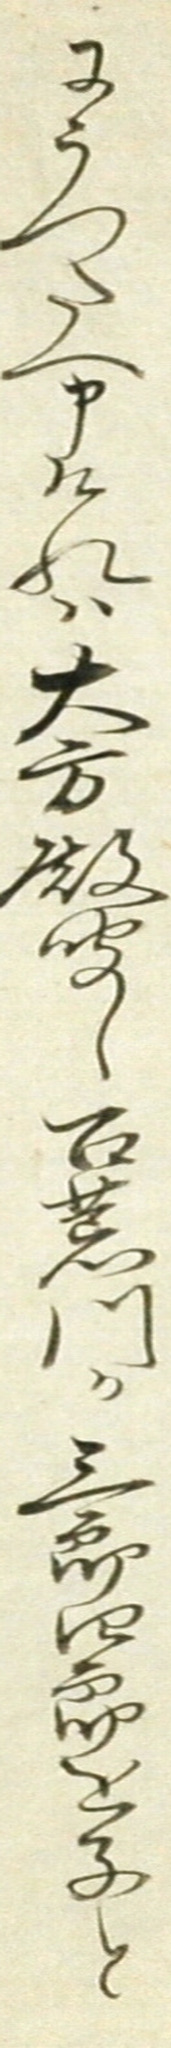にうつたへ申けれは大方殿聞し召荒川か三郎四郎を子と
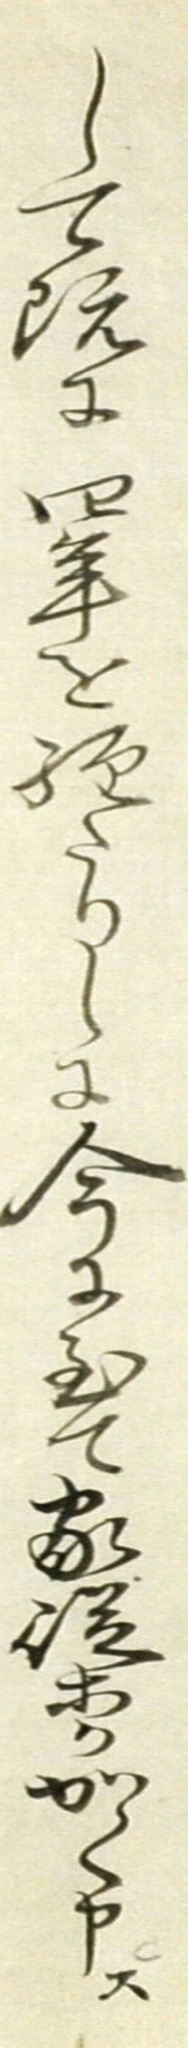して既に四年を経たりしに今に至て家従等かかく申
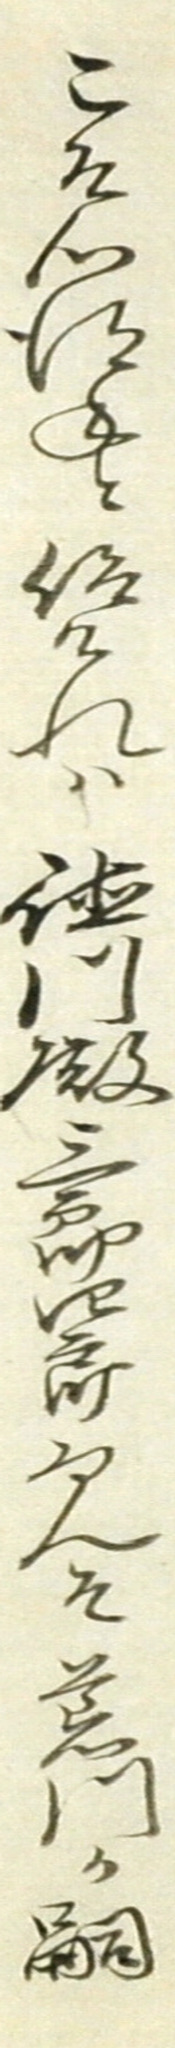こそ心得ねと仰けれは徳川殿三郎四郎なんそ荒川か嗣
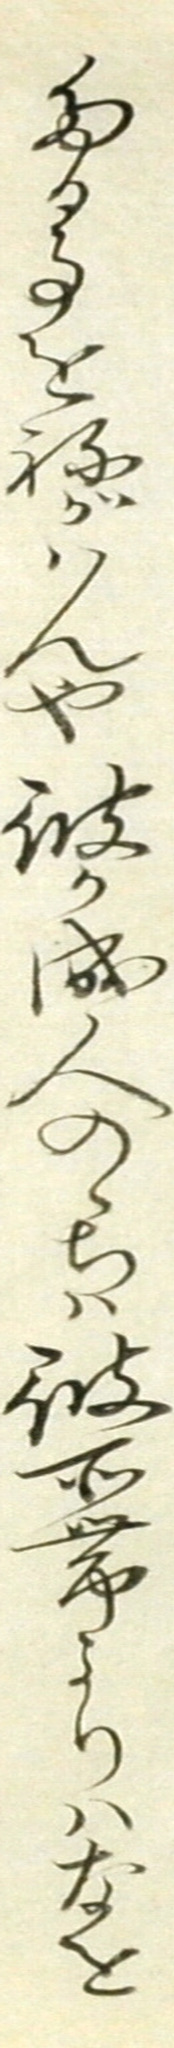たる事をねがはんや彼か成人のゝちは彼所帯よりはなを
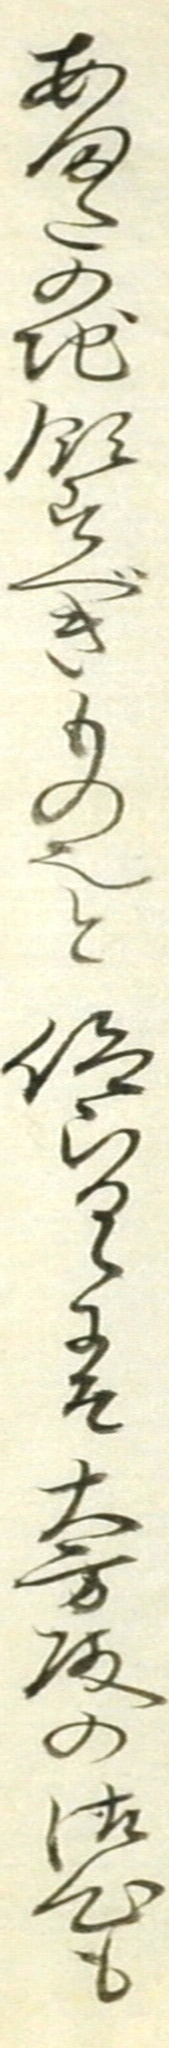あまたの地領すべきもの也と仰らるゝにそ大方殿の御心も
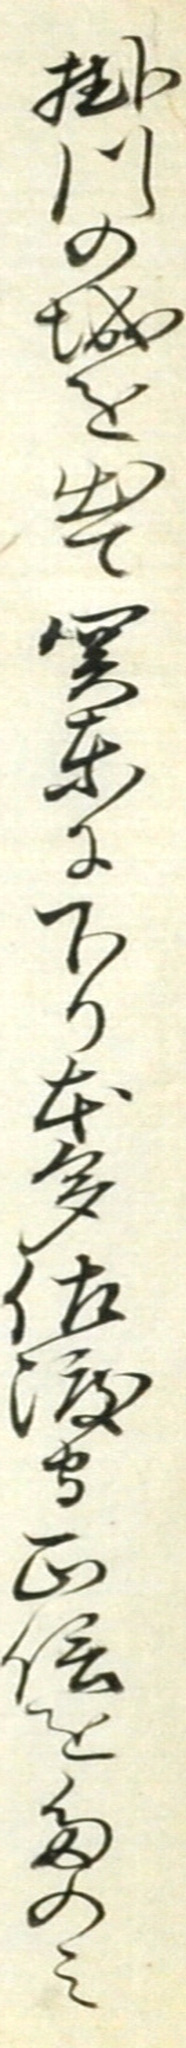掛川の城を出て関東に下り本多佐渡守正信をたのみ
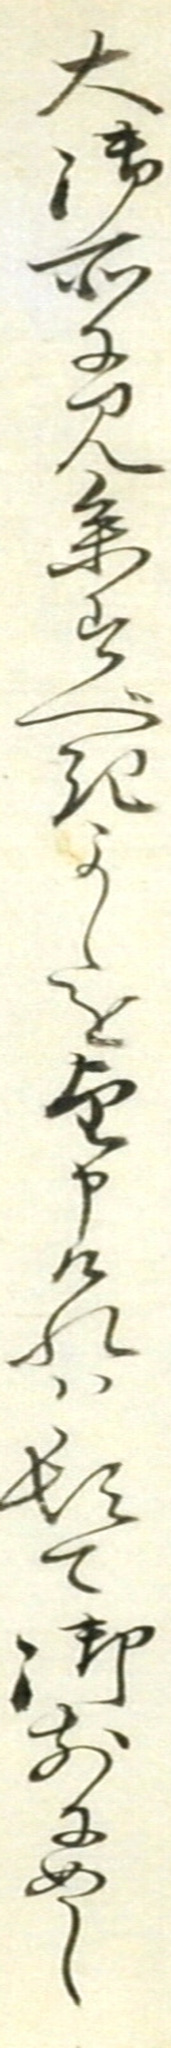大御所に見参すべきよしを望申けれは頓て御前にめし
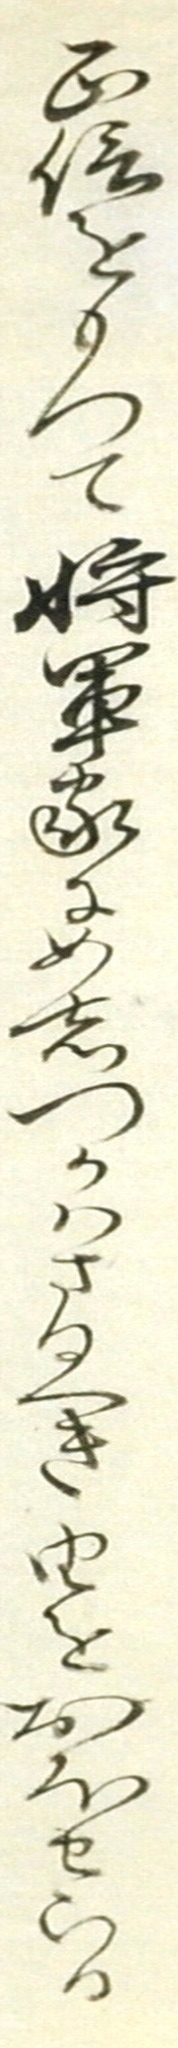正信をもつて将軍家にましつかはさるへき由をおほせらる
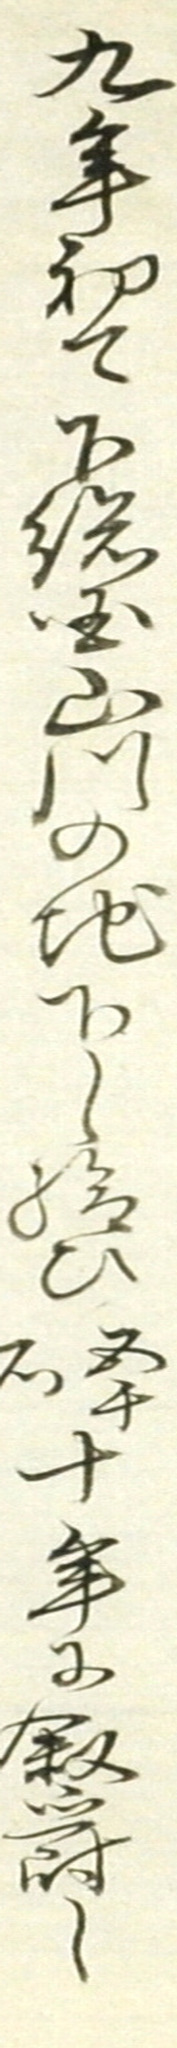九年初て下総国山川の地下し給ひ五千石十年に叙爵し
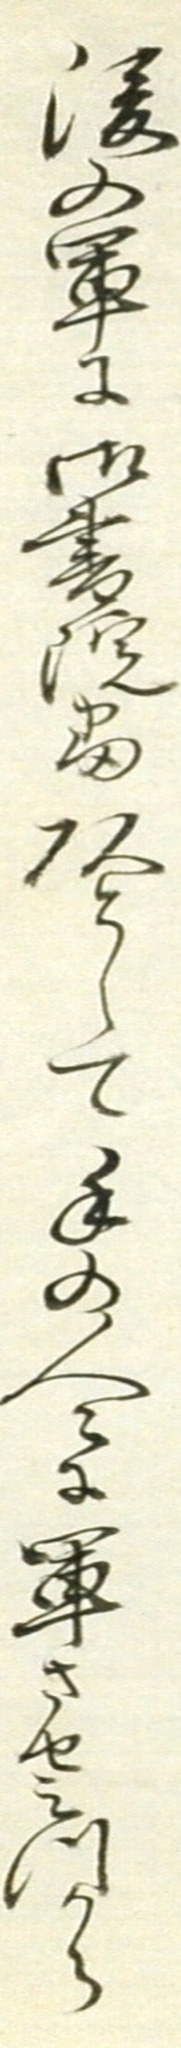後の軍に御書院番頭として手の人々に軍させみつから
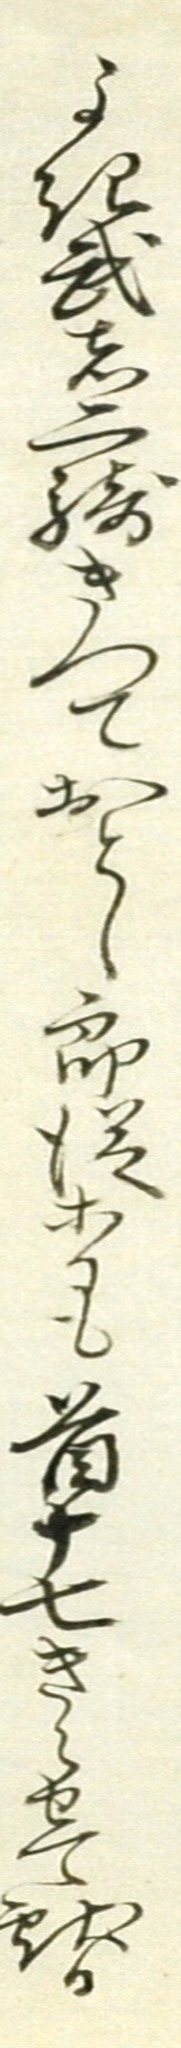よき武者二騎きつておとし郎従等にも首十七きらせて献る

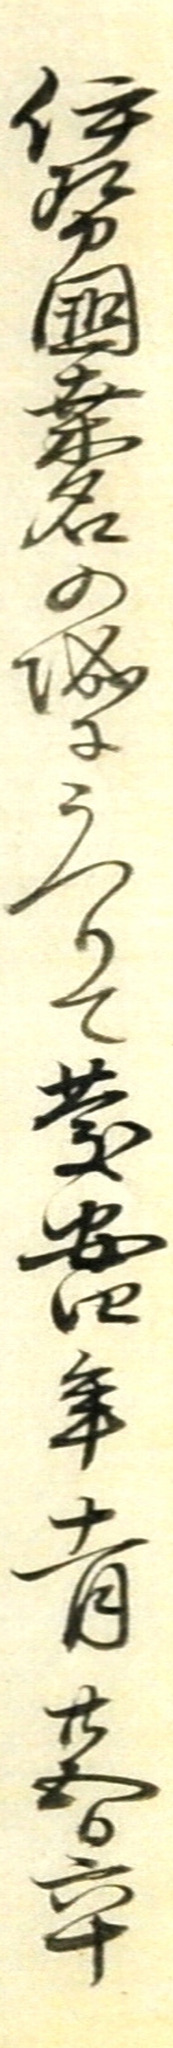伊勢国桑名の城にうつりて慶安四年十一月廿五日六十
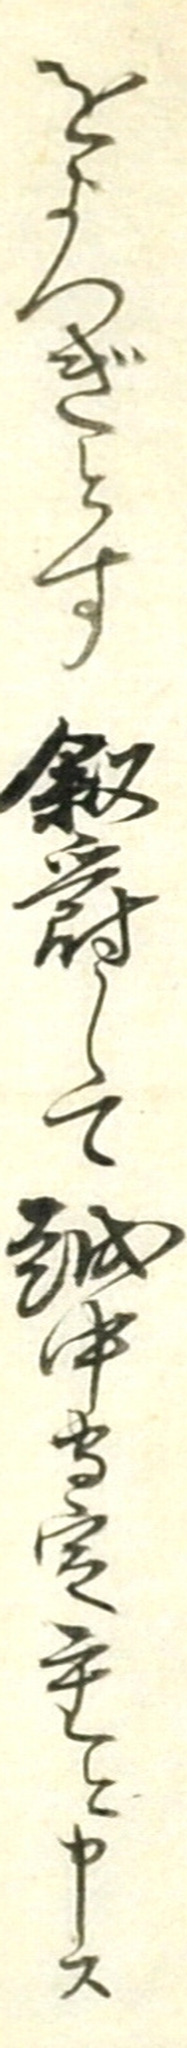をよつぎとす叙爵して越中守定重と申ス
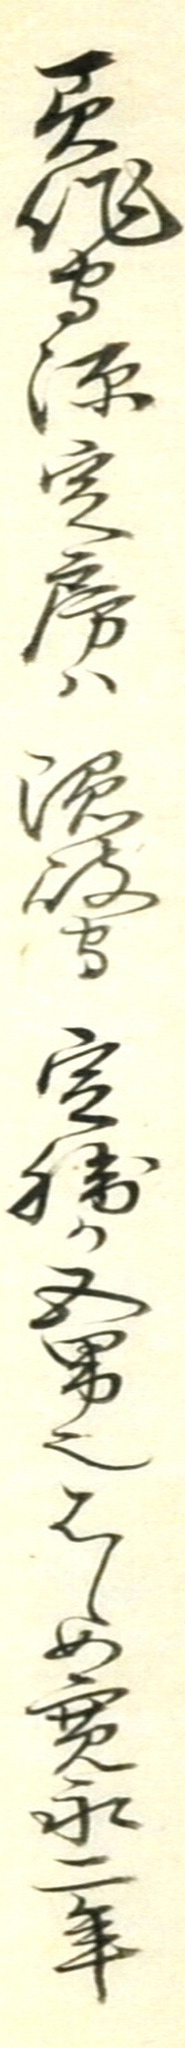美作守源定房は隠岐守定勝か五男也はしめ寛永二年
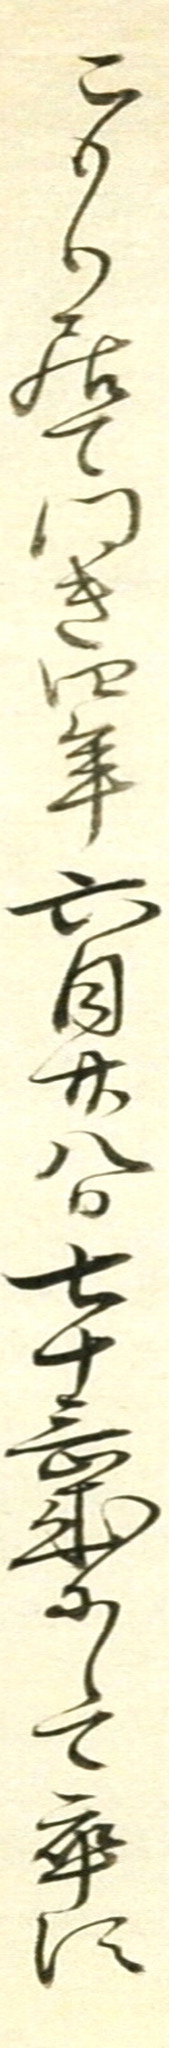こもり居て同き四年六月廿八日七十三歳にして卒す
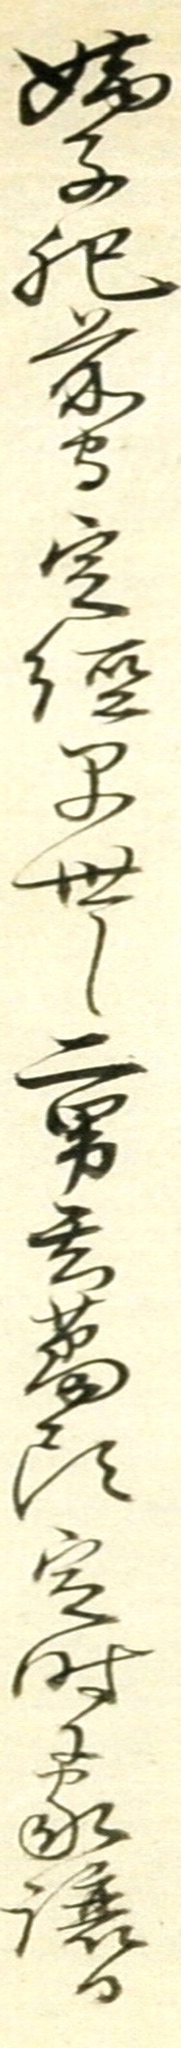嫡子肥前守定経早世し二男玄蕃頭定時に家譲る
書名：藩翰譜（二・三）
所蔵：伊那市立高遠町図書館・合同会社AMANE
